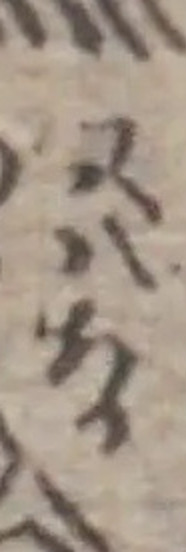又八あり
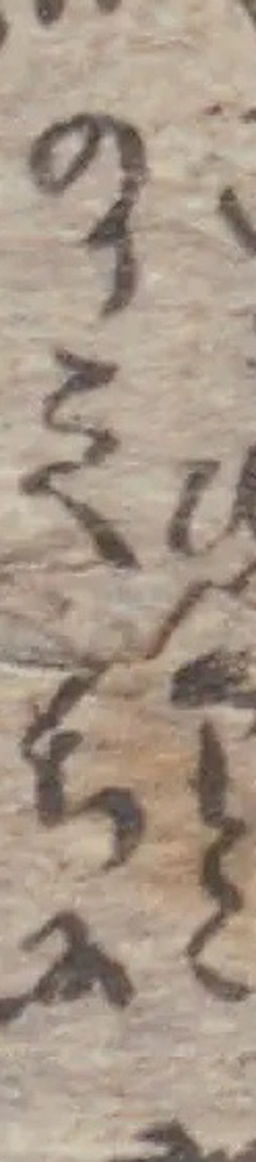のりこへちに
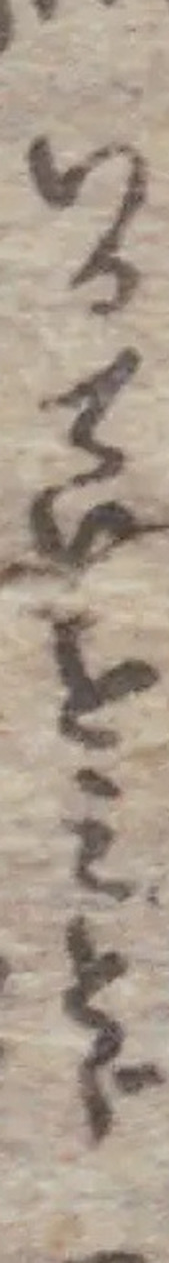るていをみとゞ

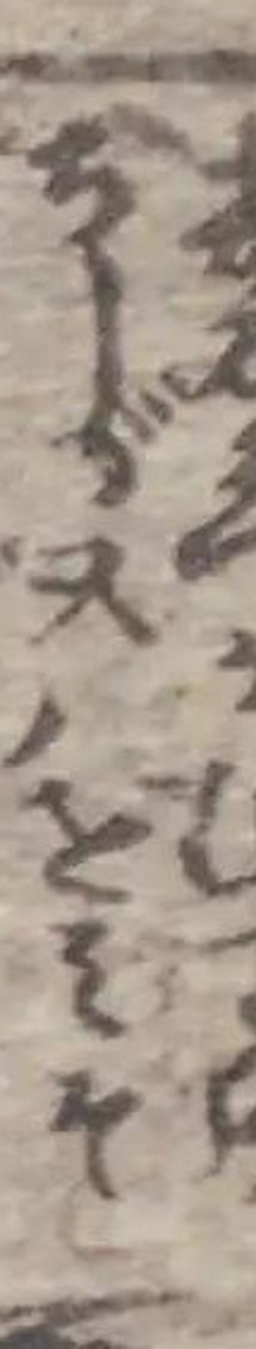おしが又八をみそ
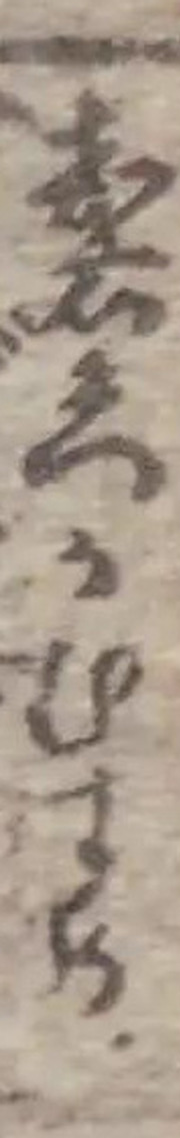嘉右衛門がむすめ
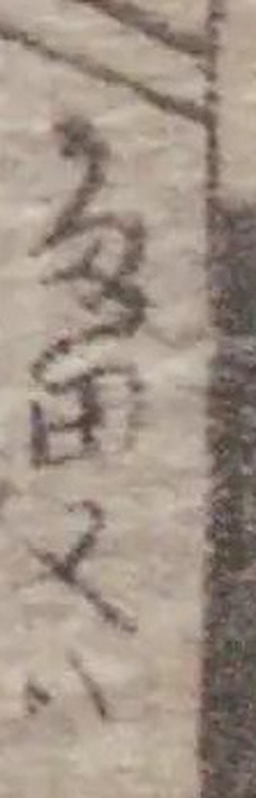かま田又八
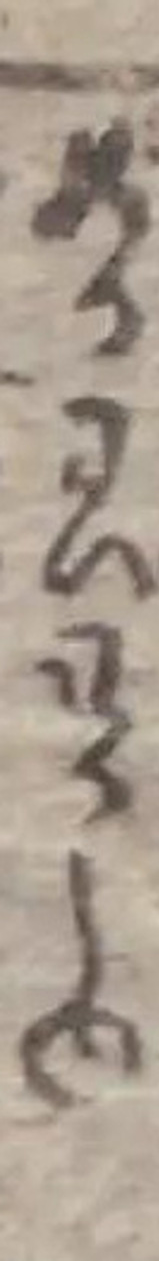めるよいわかしゆ
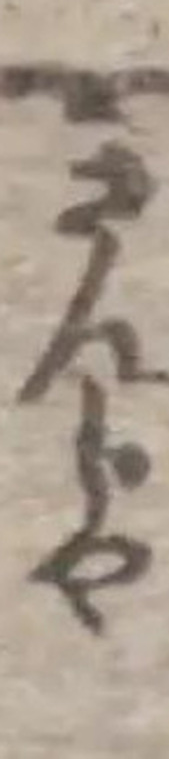さんじや
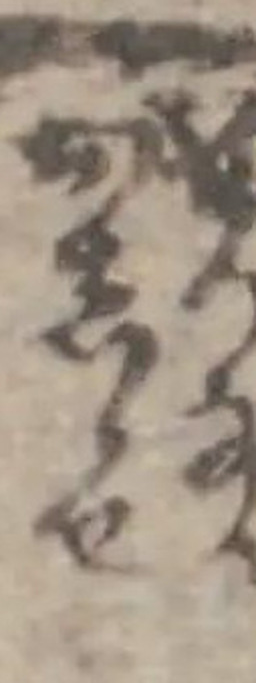おしらせ
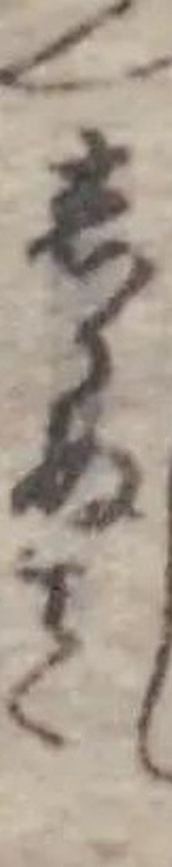しらぬこと
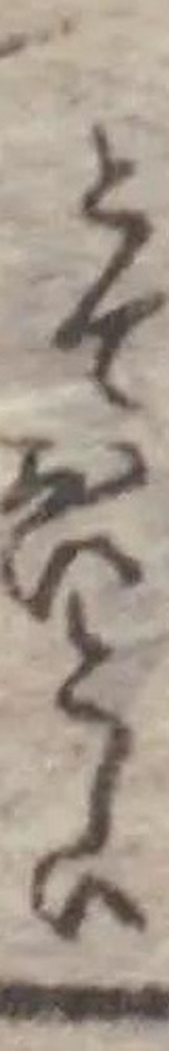とておいとしい
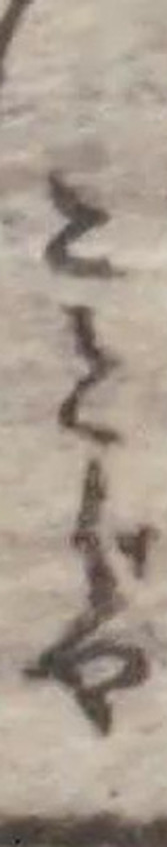ことじや
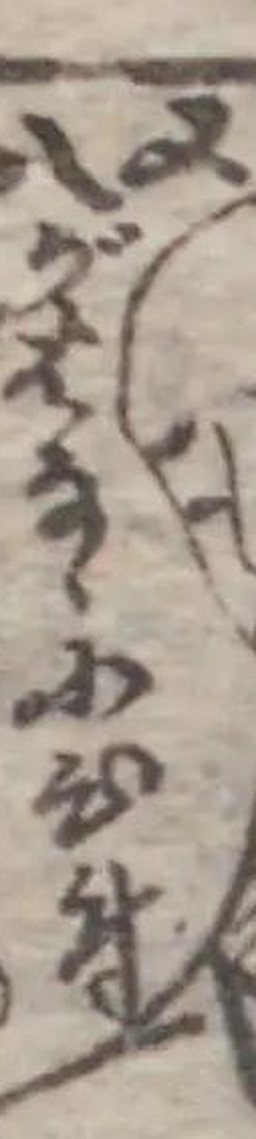八がはなしに出付
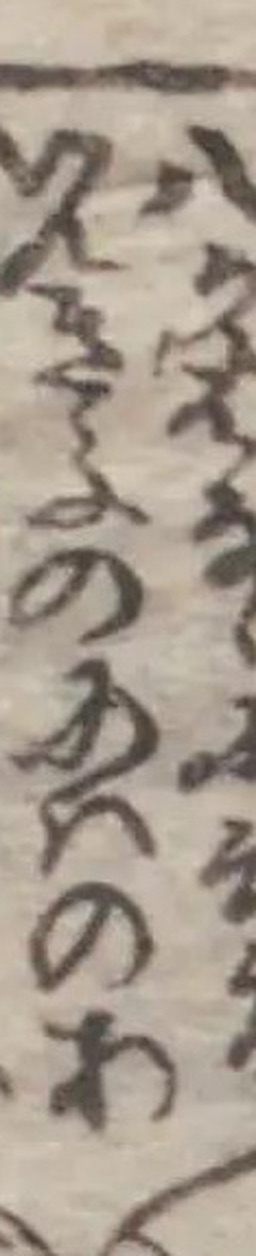いんきよのにはのあ
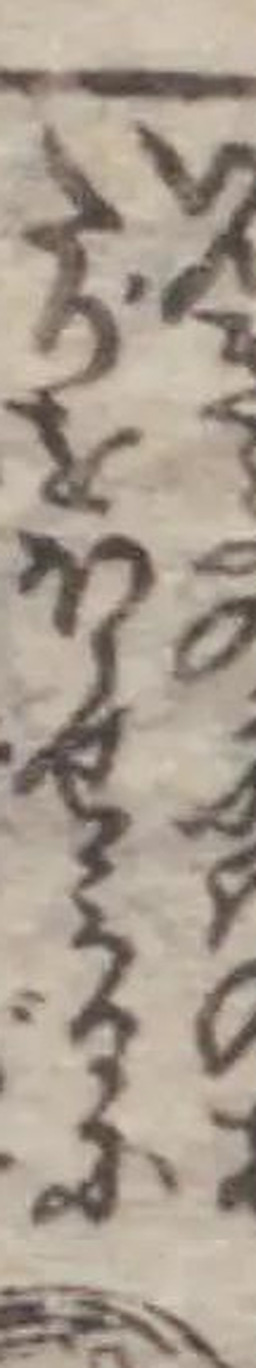たりをほらせみるに
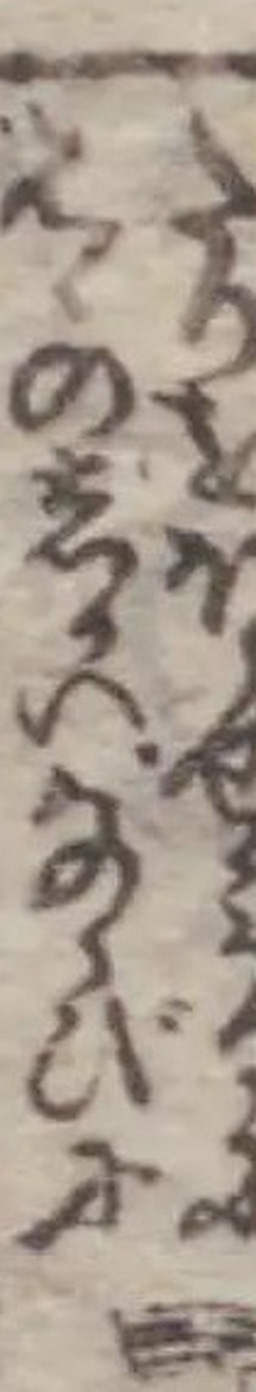はゝのしかいならびに
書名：鎌田又八 2巻
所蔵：国立国会図書館 National Diet Library, JAPAN
